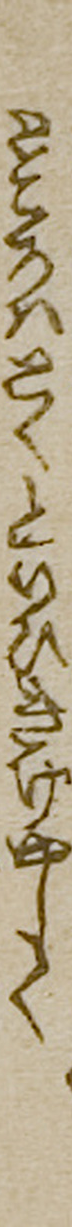ところはとくといひきけやして
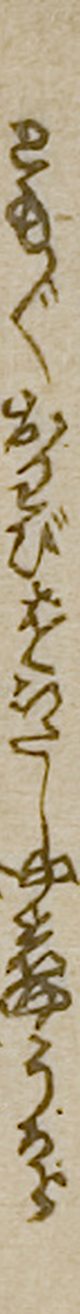とも〴〵おわびをいたしやしやうから
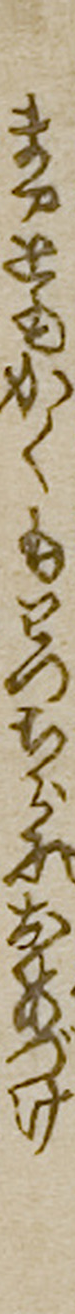まあともかくもわつちらにおあづけ
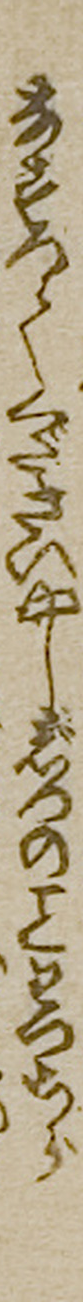なすつてくださいやしじつのことわつちら
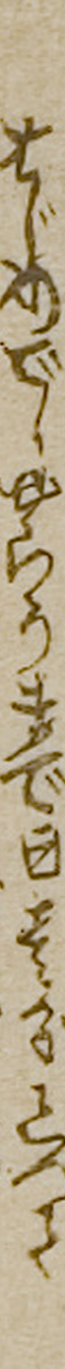はじめでしやらうまで日壱分とつて
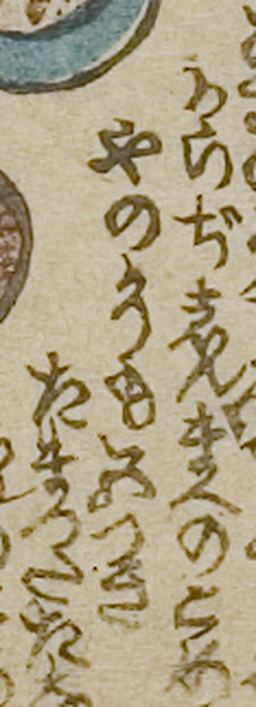やのかりも五つき
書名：生捕ました三度の大地震
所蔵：東京大学総合図書館 General Library in the University of Tokyo, JAPAN
